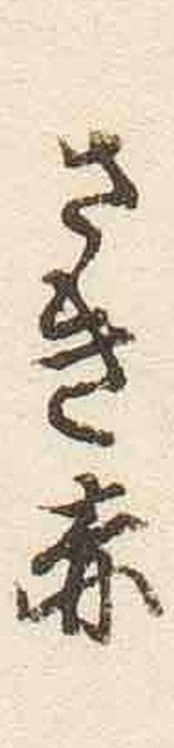さき赤
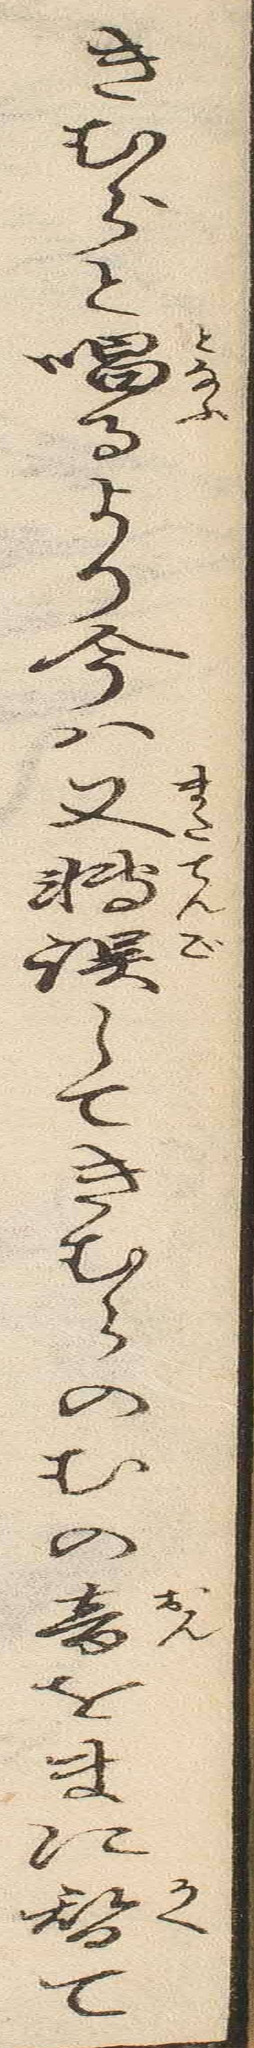きむらと唱るより今は又轉誤してきむらのむの音をまに替て
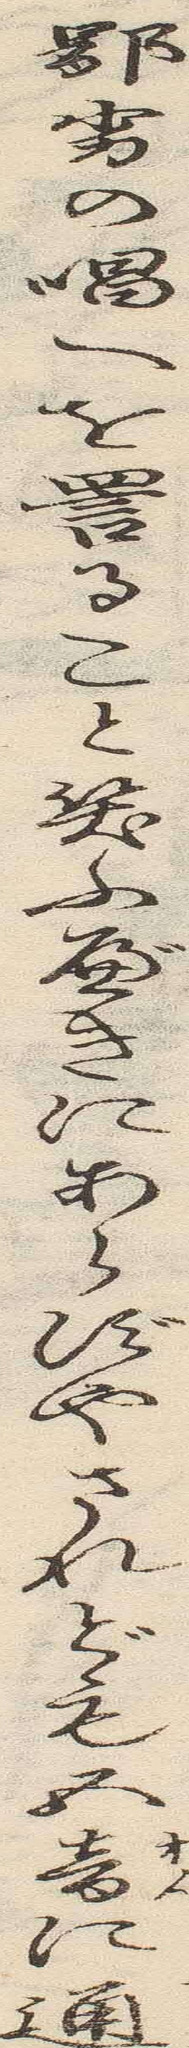鄙劣の唱へを詈ること笑ふべきにあらずやされども五音に通
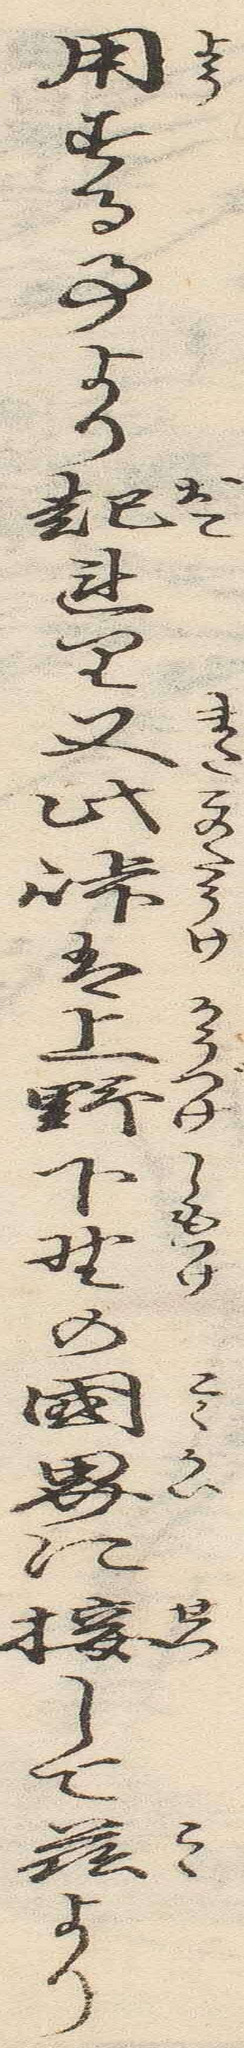用する事より起れり又此峠は上野下㙒の國界に接して兹より
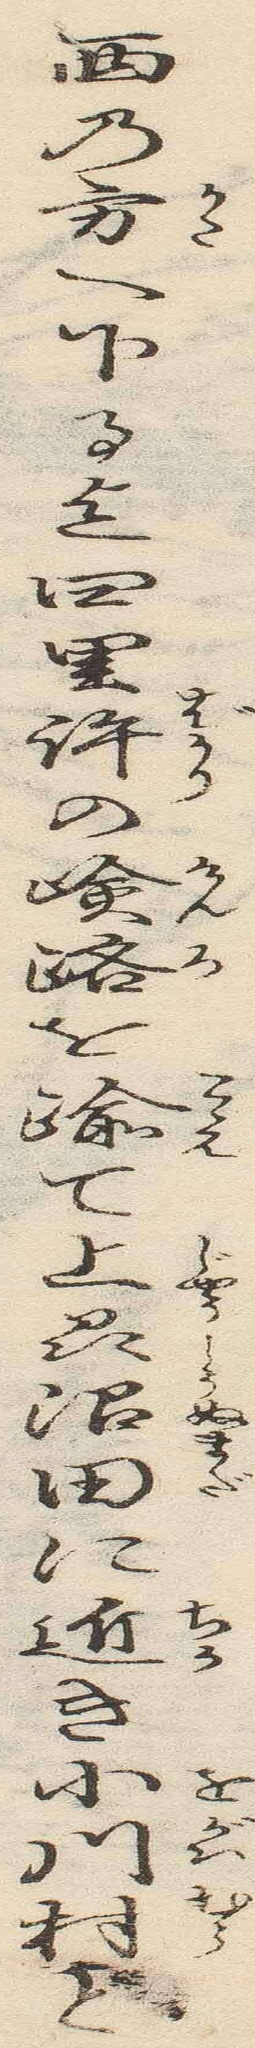西の方へ下る迄四里許の𡸴路を踰て上刕沼田に近き小川村と
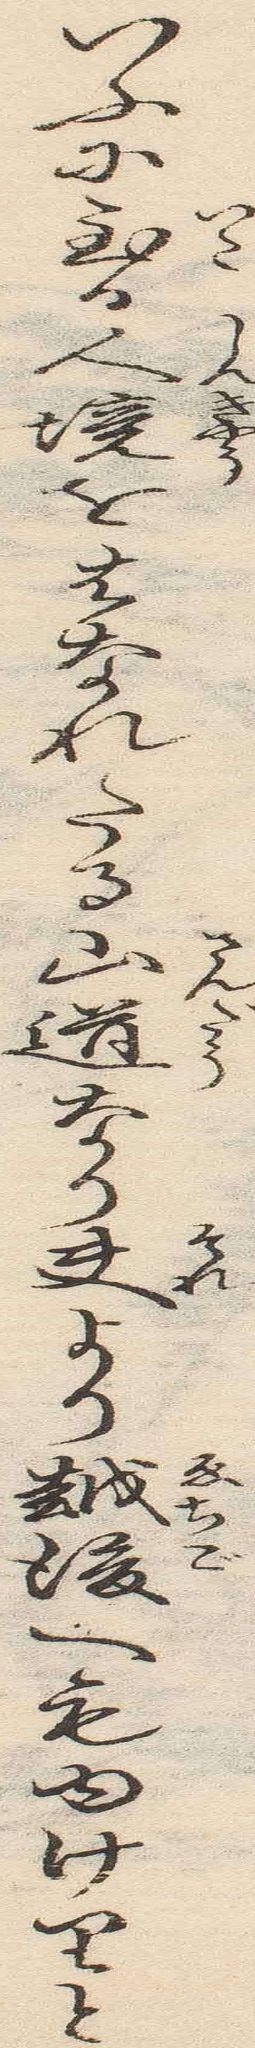いふに至る人境をはなれたる山道なり夫より越後へもゆけりと
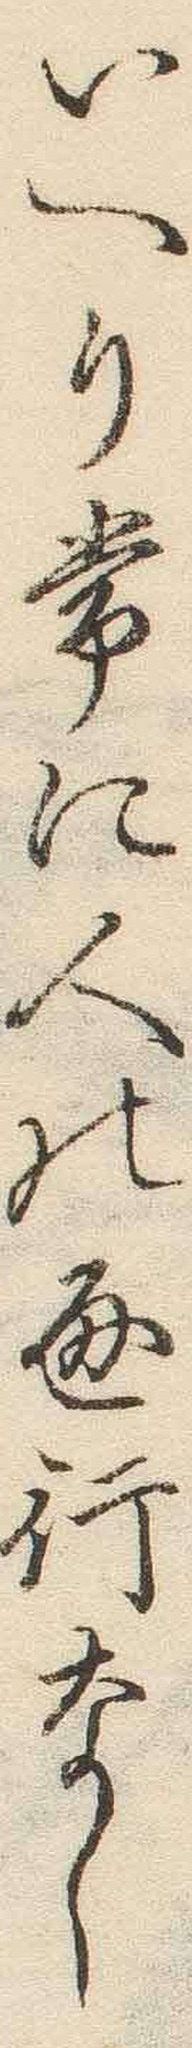いへり常に人の通行なし
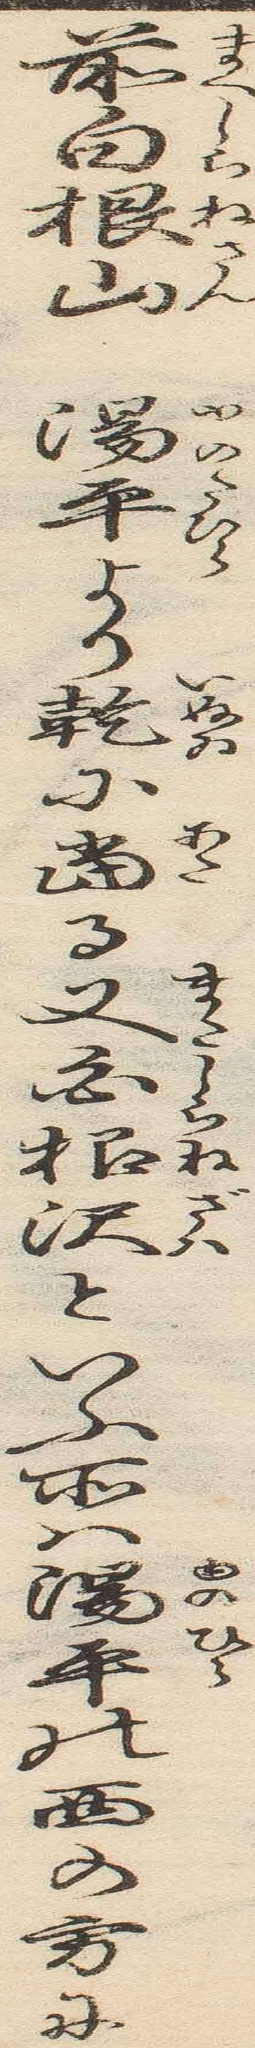前白根山湯平より乾に當る又白根沢といふ所は湯平の西の方に
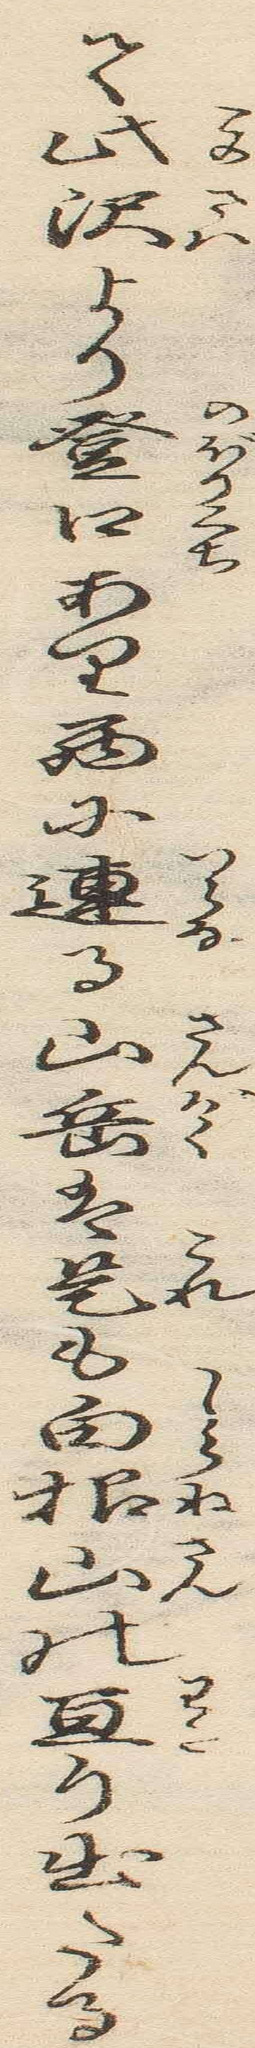て此沢より登口あり西に連る山岳は是も白根山の亘り出たる
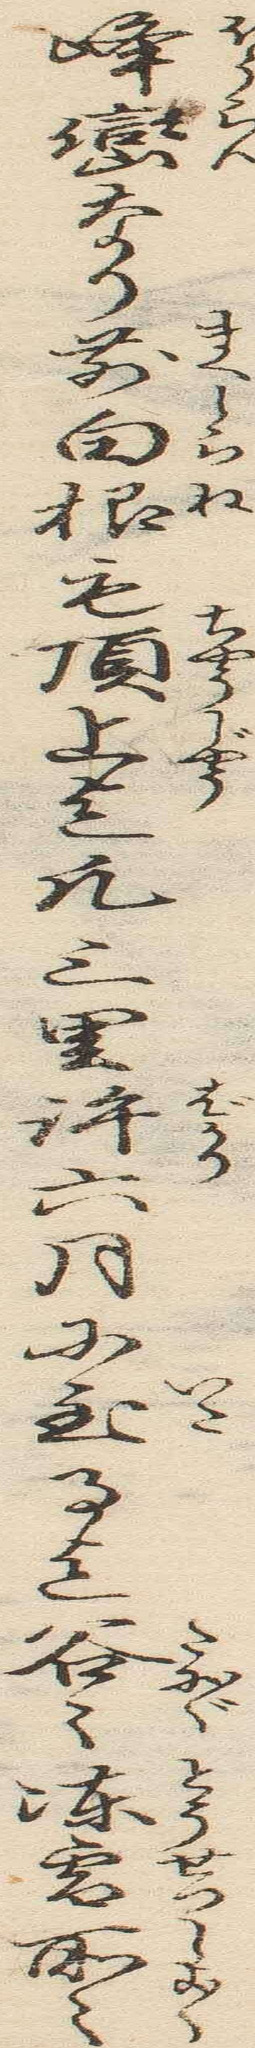峰巒なり前白根も頂上迄凢三里許六月に至る迄谷〻凍雪所〻
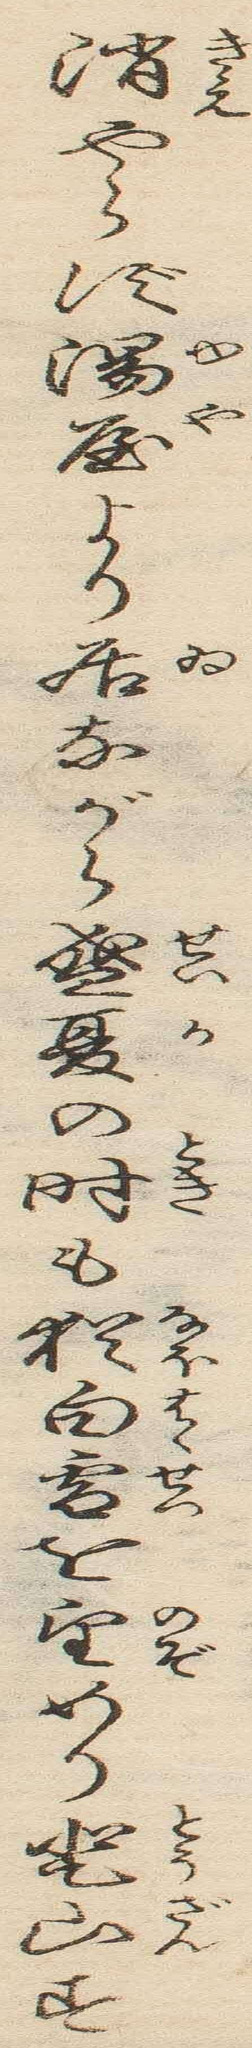消やらず湯屋より居ながら盛夏の时も猶白雪を望めり登山す
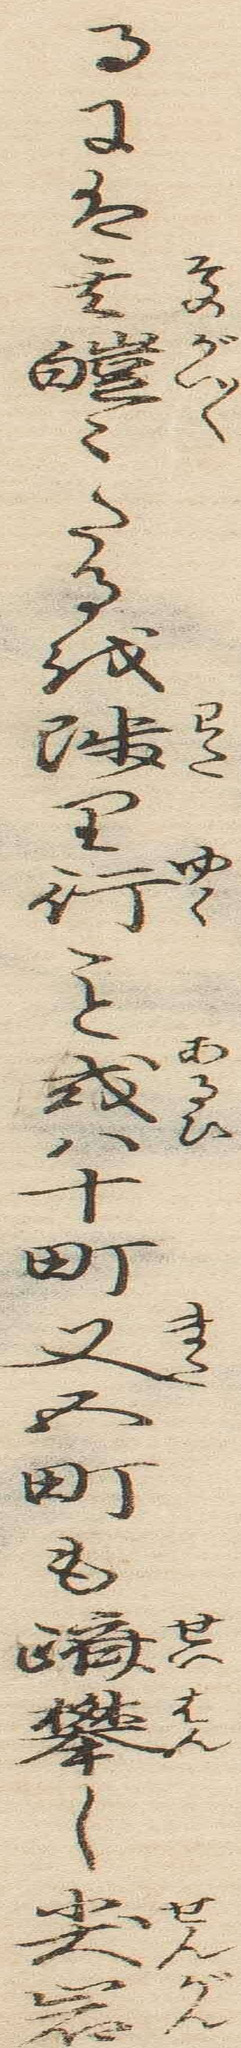るには其皚〻たるを陟り行こと或は十町又五町も躋攀し尖岩
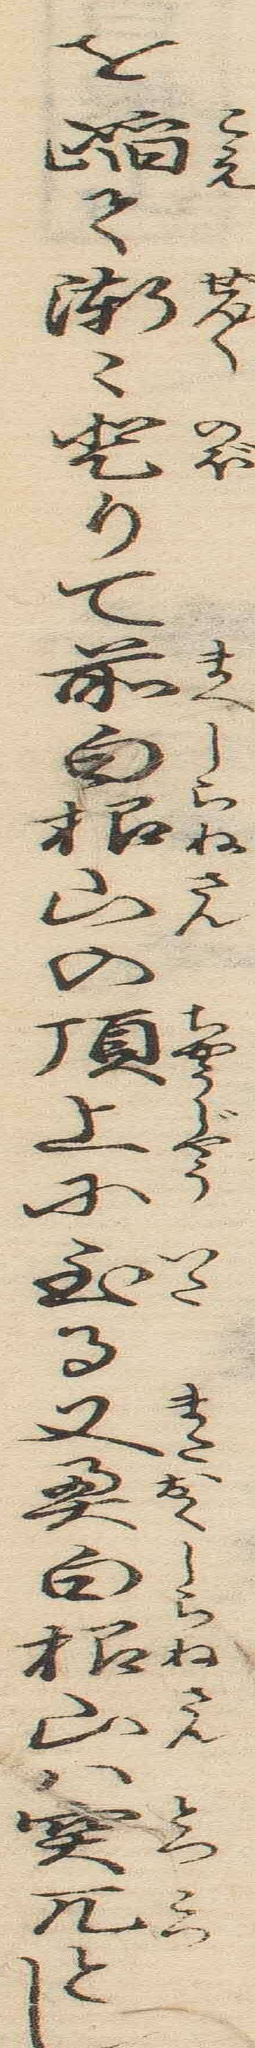を𨂻て漸〻登りて前白根山の頂上に至る又奥白根山は突兀とし

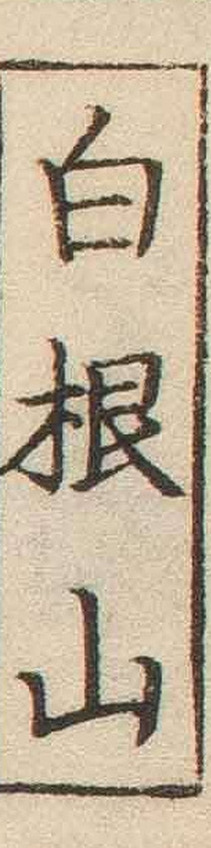白根山
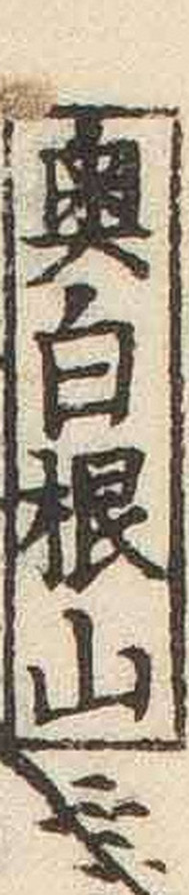奥白根山

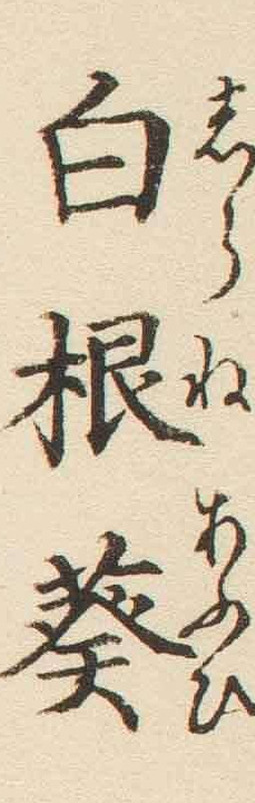白根葵
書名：日光山志
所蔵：東京学芸大学附属図書館 国文学研究資料館
